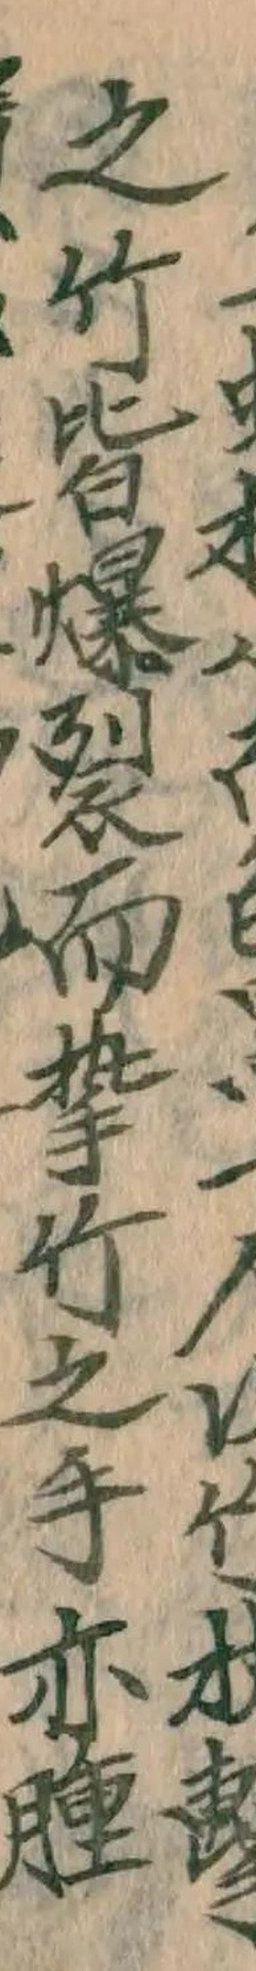之竹皆爆裂而挚竹之手亦腫
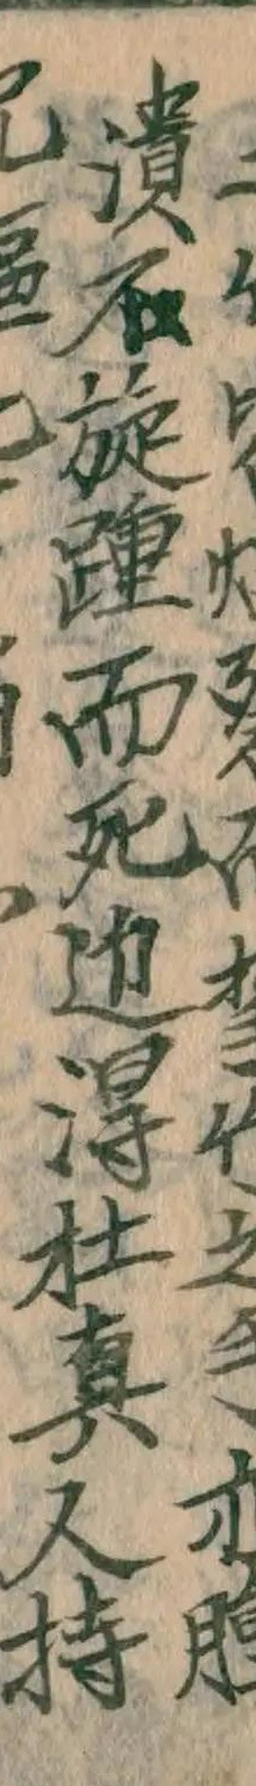潰不旋踵而死近淂杜真人持
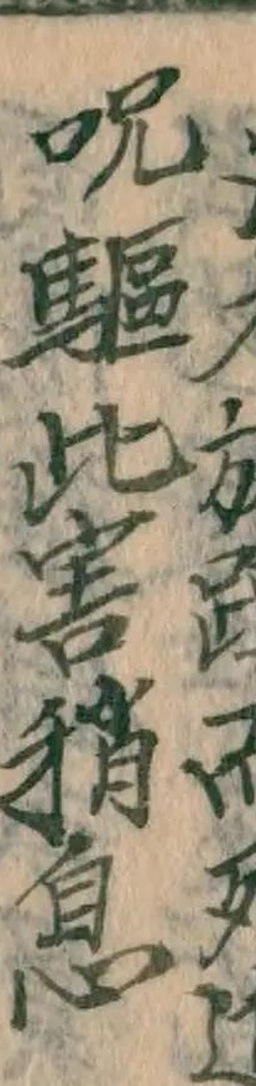呪驅此害稍息
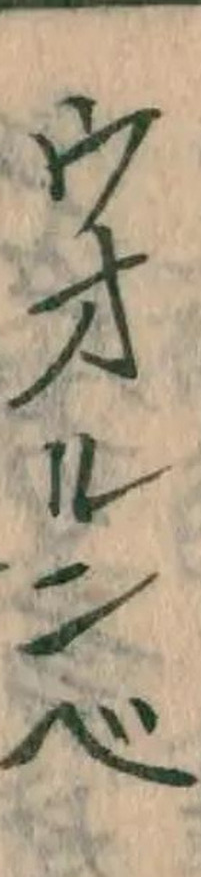ウオルンベ
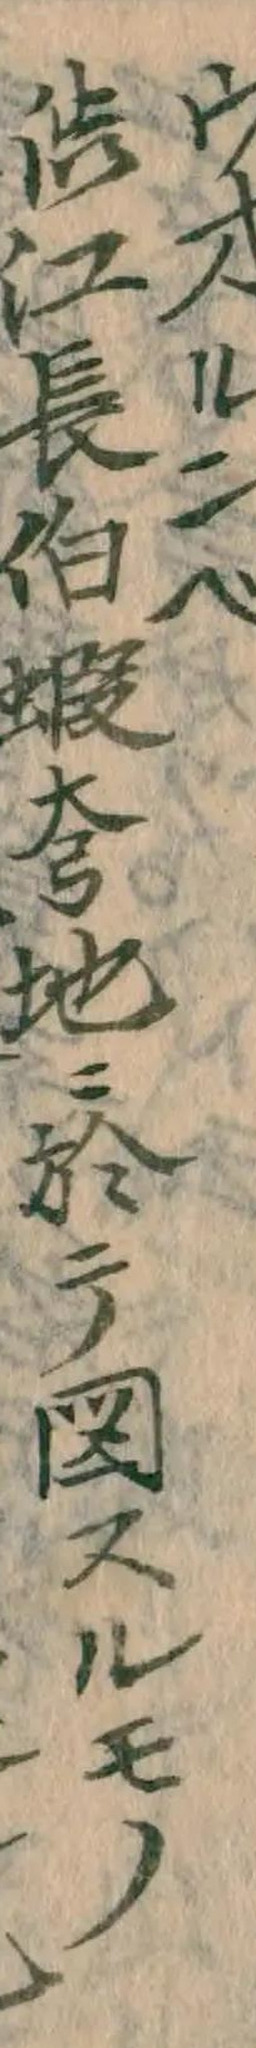渋江長伯蝦𡗝地ニ於テ図スルモノ
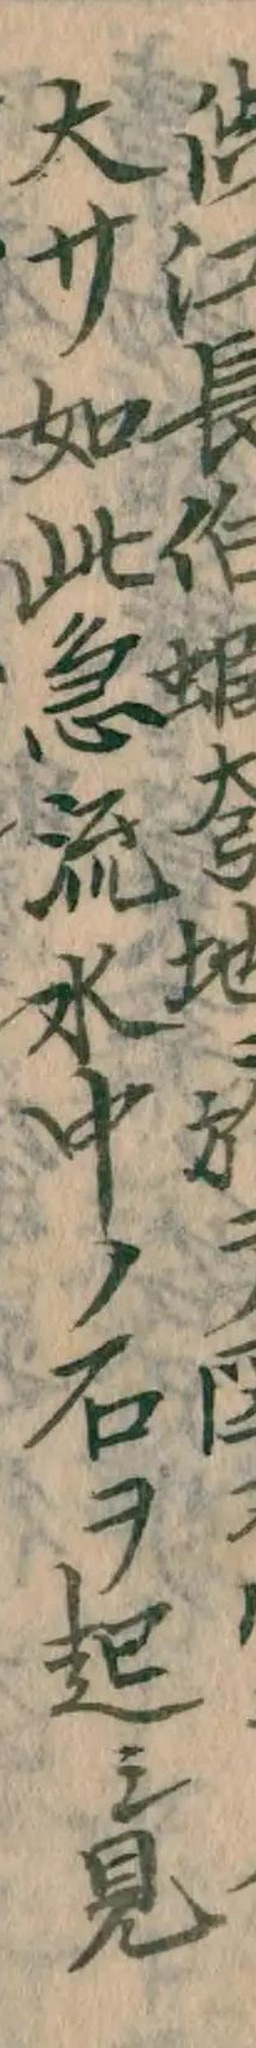大サ如此急流水中ノ石ヲ起シ見
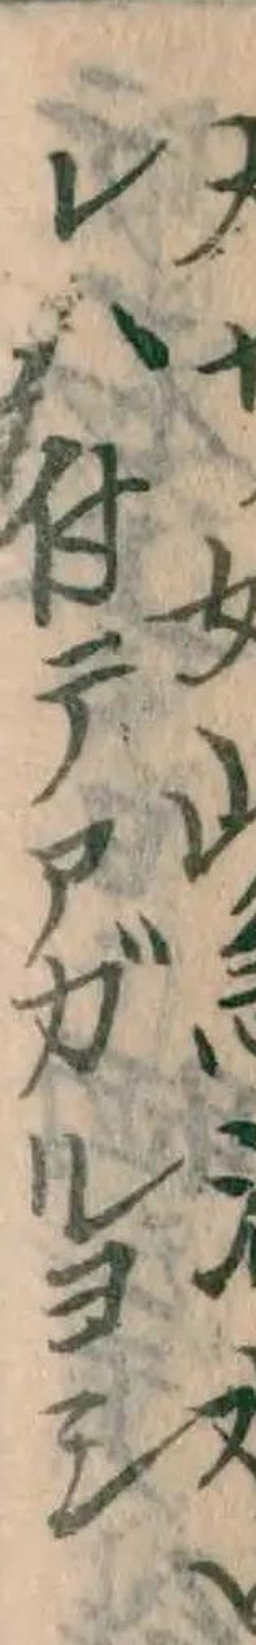レハ付テアガルヨシ
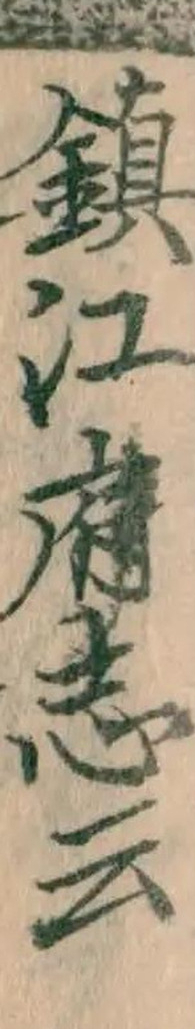鎮江府志云
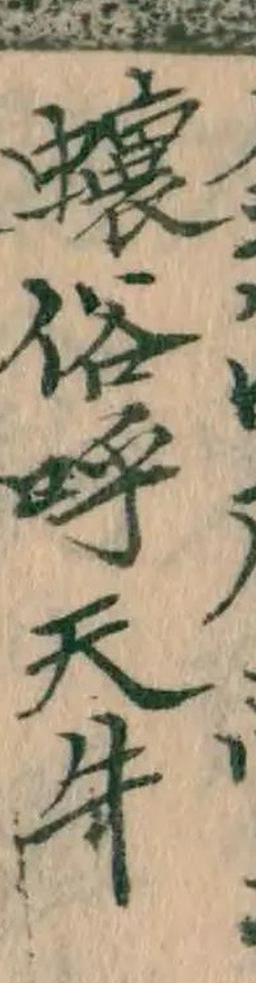蠰俗呼天牛
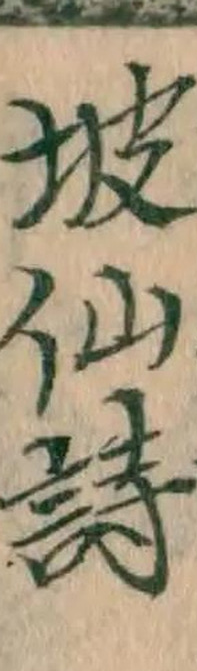坡仙詩
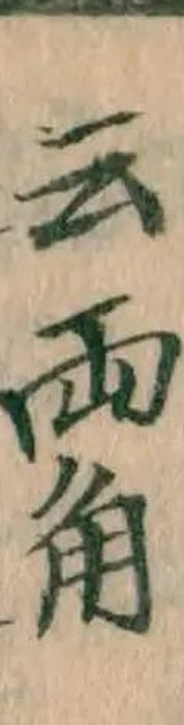云両角
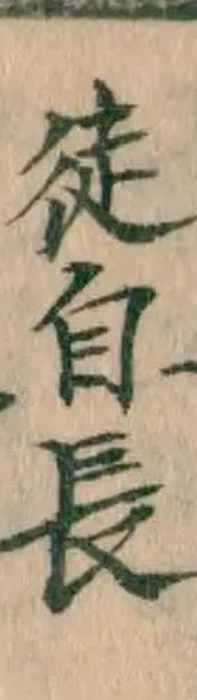徒自長
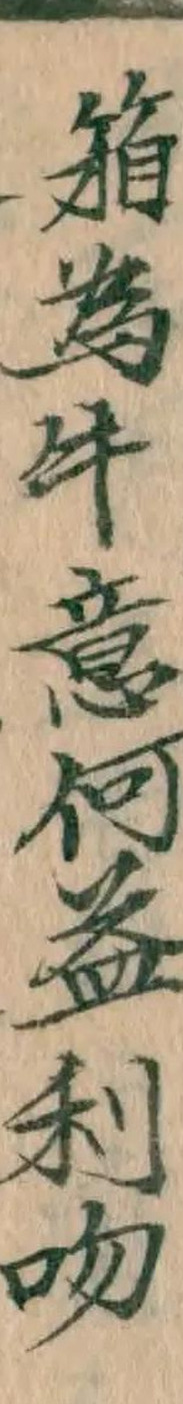箱為牛意何益利吻
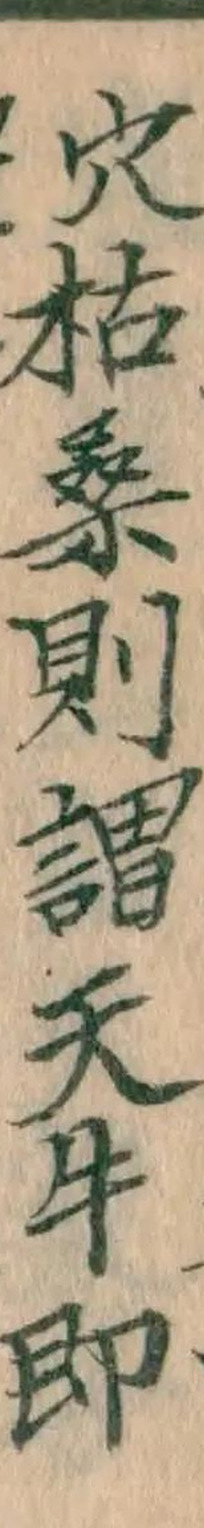穴枯桑則謂天牛即
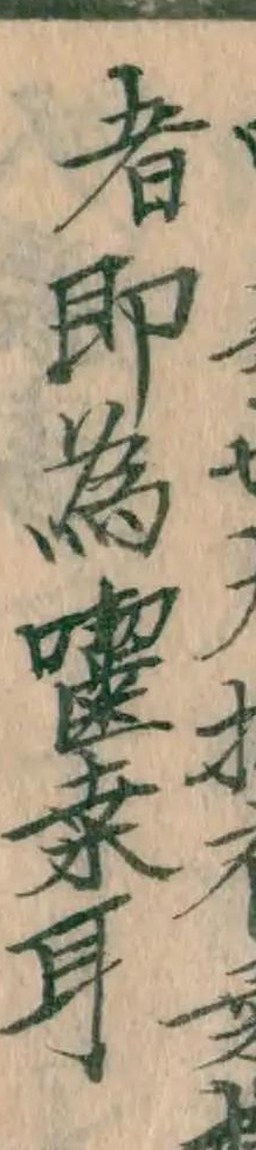者即為齧桒耳
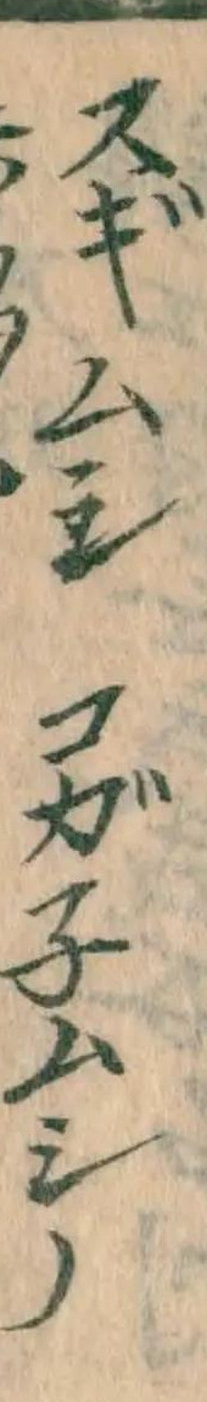スギムシコガネムシノ
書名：千蟲譜 3巻. [3]
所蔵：国立国会図書館 National Diet Library, JAPAN
